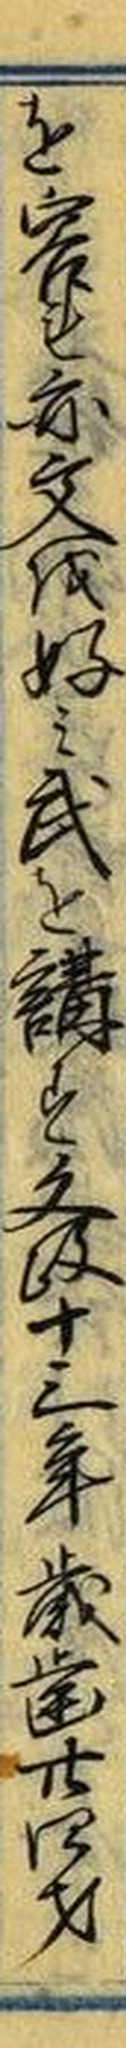を容す亦文を好ミ武を講す文政十三年歳歯廿四才

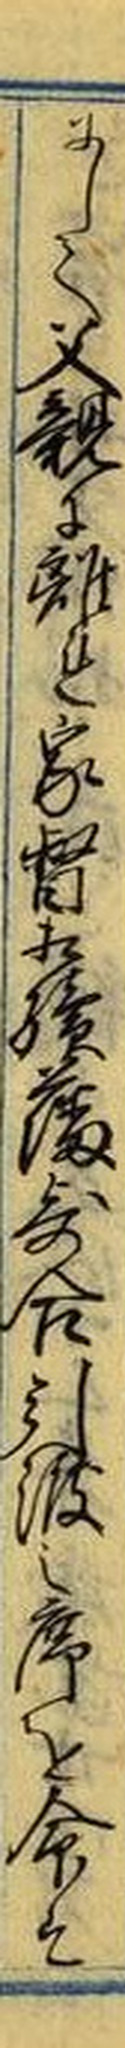にて父親に離れ家督相続藩歩合引渡之席を命す
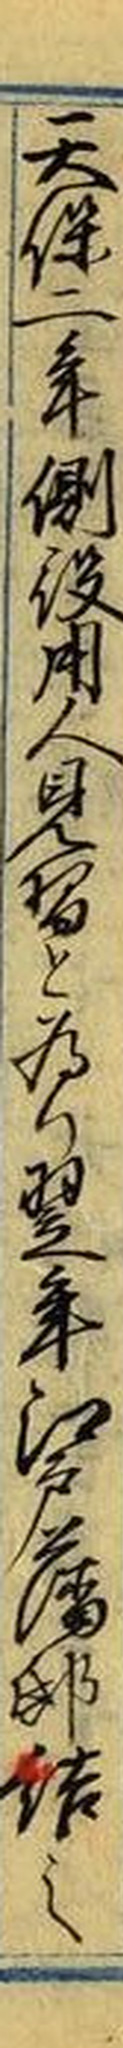天保二年側役用人見習と為り翌年江戸藩邸詰之
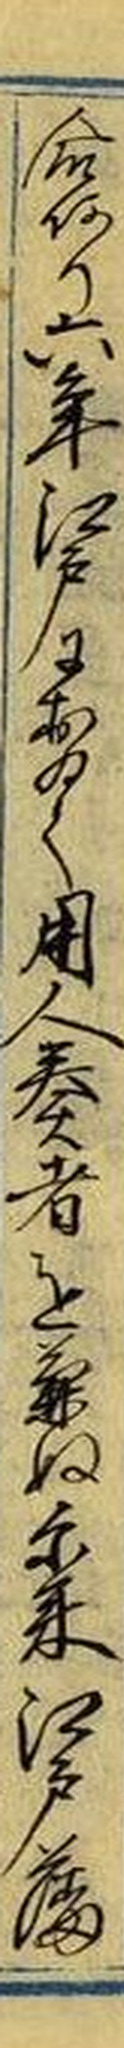命あり六年江戸におゐて用人奏者を兼ね爾来江戸藩
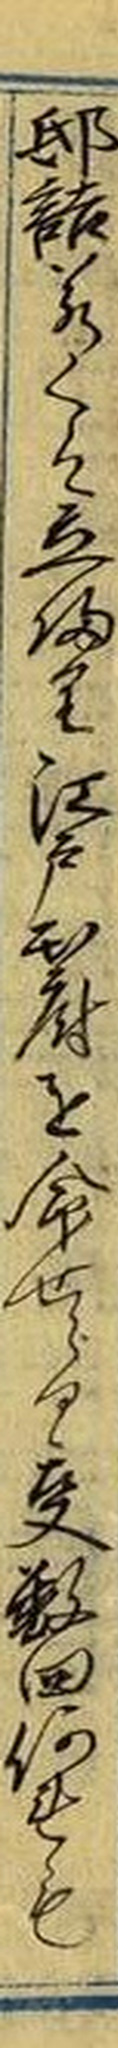邸詰若くして立帰り江戸出府を命せらるゝ事数回あれも
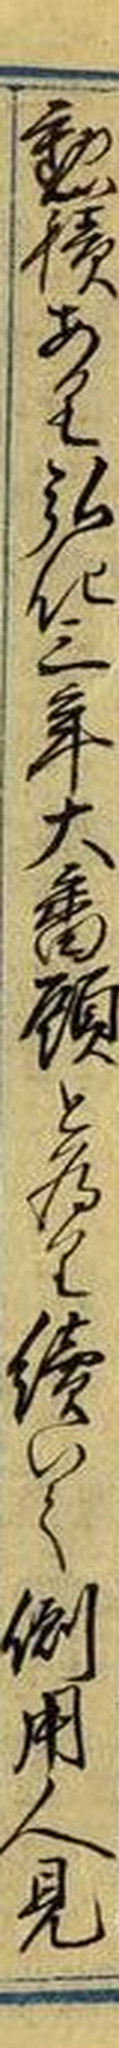勲績あり弘化三年大番頭と為り続いて側用人見
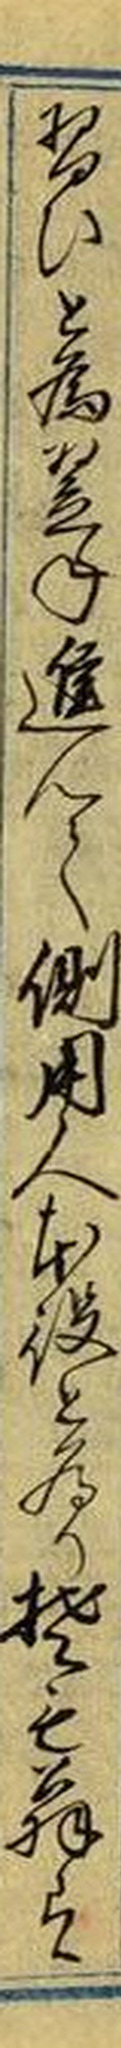習ひと為翌年進んて側用人本役と為りそも翁は
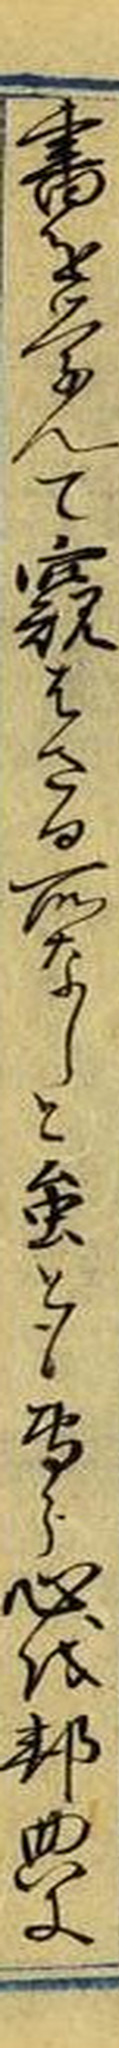書を学んて窺はさる所なしと雖とも専ら心を邦典に
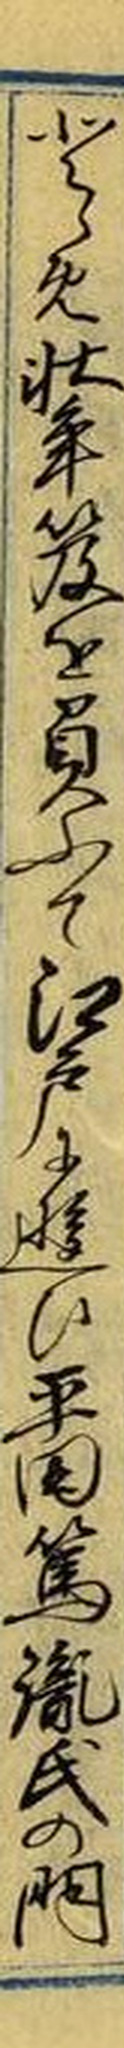登らめ壮年笈を負ふて江戸に遊ひ平田篤胤氏の門
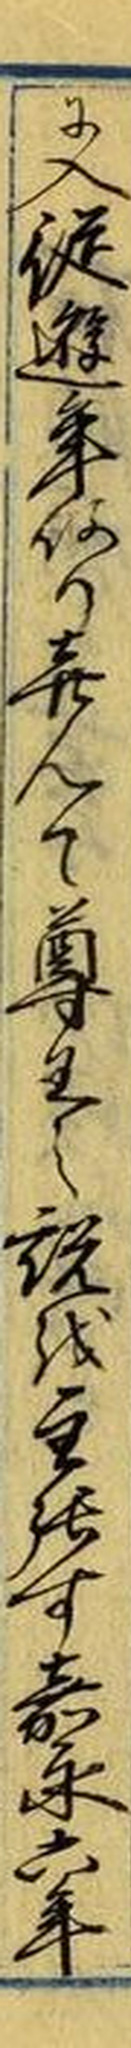に入従遊年あり喜んて尊王之説を主張す嘉永六年
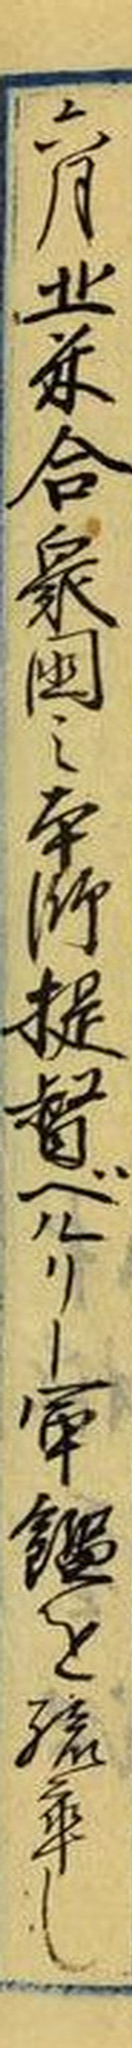六月北米合衆国之本師提督べㇽリー軍艦を統率し
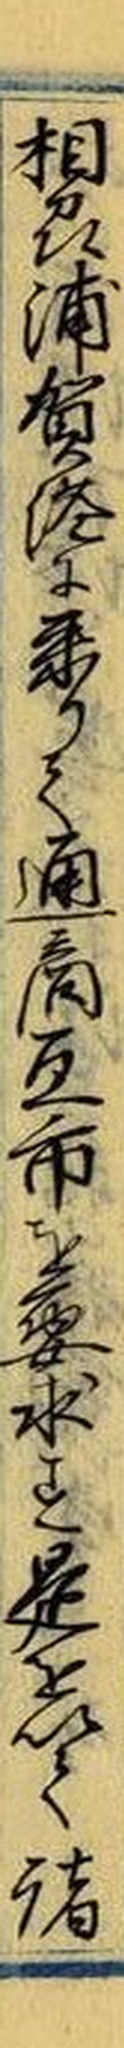相州浦賀港に来りて通商互市を要求す是を以て諸
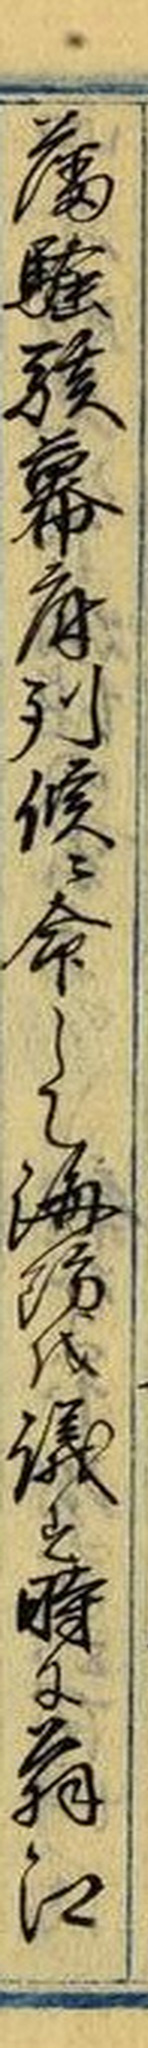属験族幕府列侯ニ命して海防を議す時に翁江
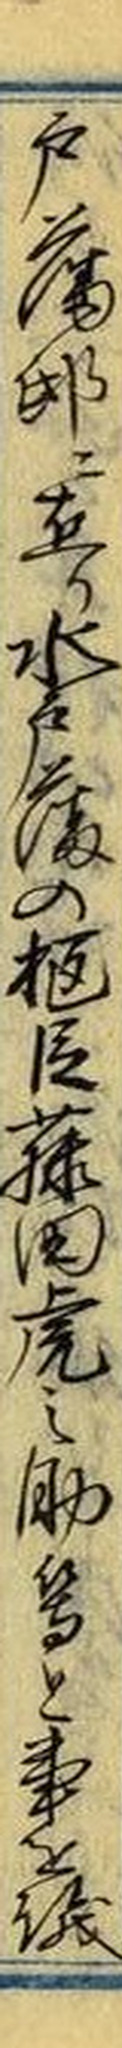戸藩邸ニ在り水戸藩の枢臣藤田虎之助等と事を議
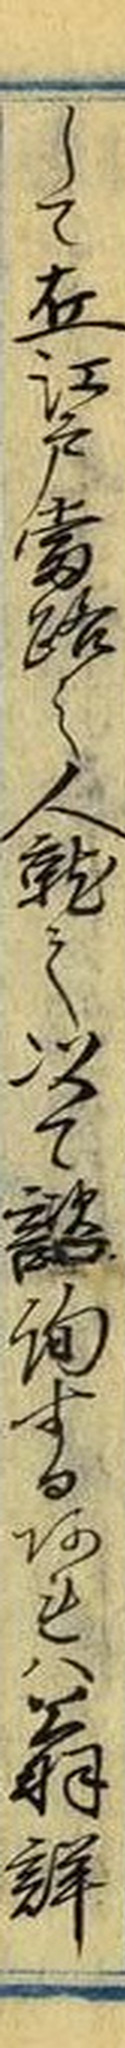して在江戸当路之人就て以て諮詢するあれハ翁詳
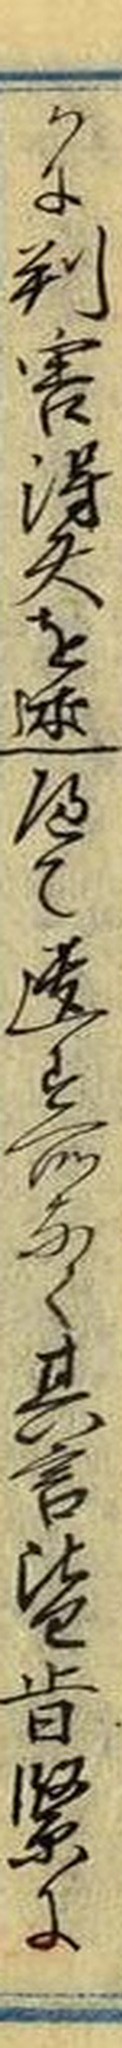かに判害得失を述べて遺す所なく其言皆肯緊に
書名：温古集 三巻
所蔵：福井県文書館 Fukui Prefectural Archives
